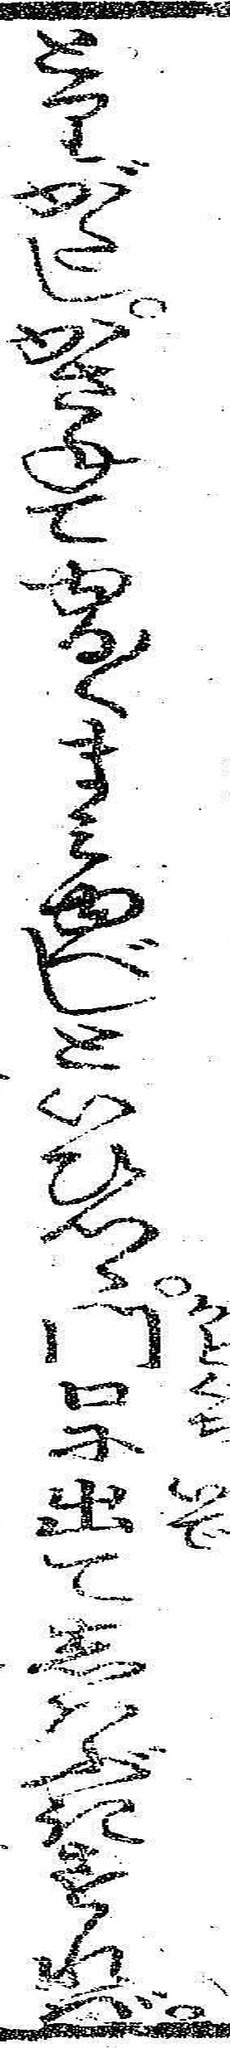とりがたし。かさねてゆる〳〵まみゆべしといひつゝ。門口に出てしはぶきすれば。
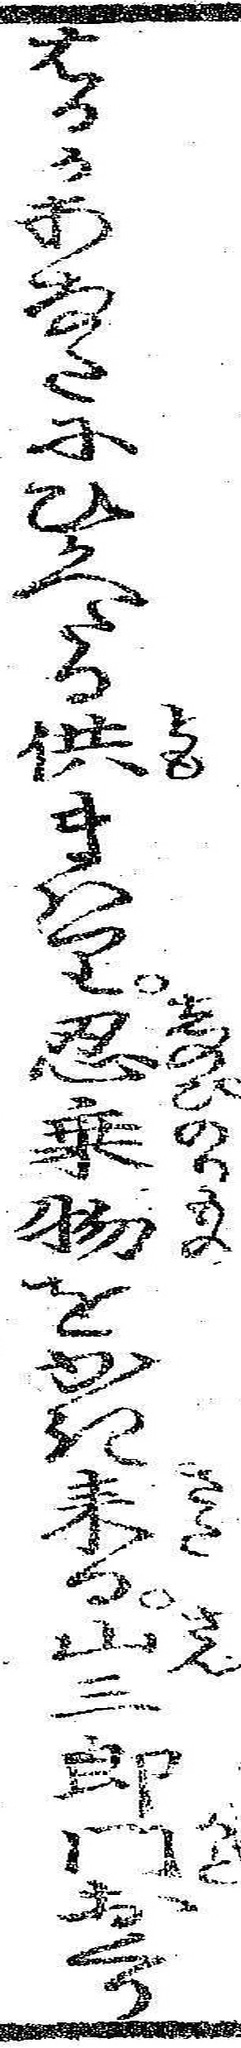はるかあなたにひかへたる供まはり。忍乗物をかき来る。山三郎門おくり
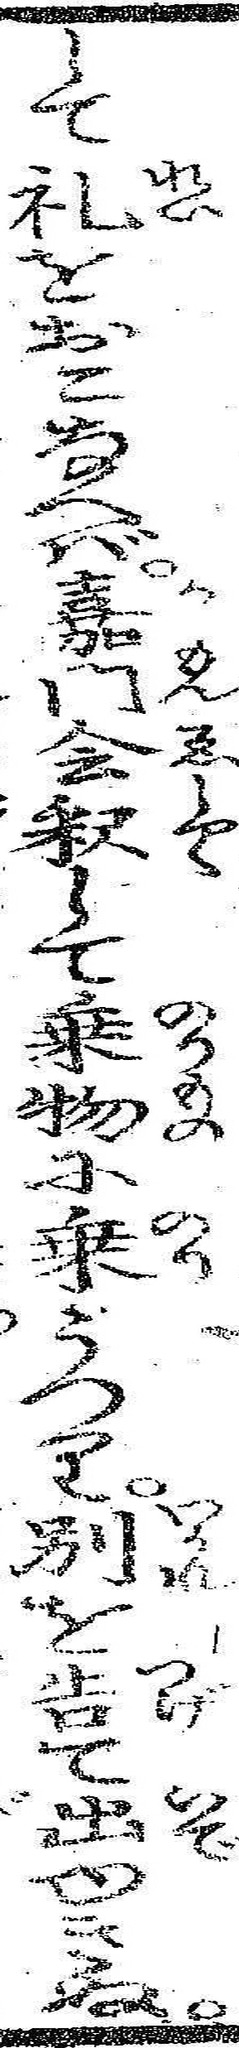して礼をおこなへば。嘉門会釈して乗物に乗うつり。別を告て出ゆきぬ。
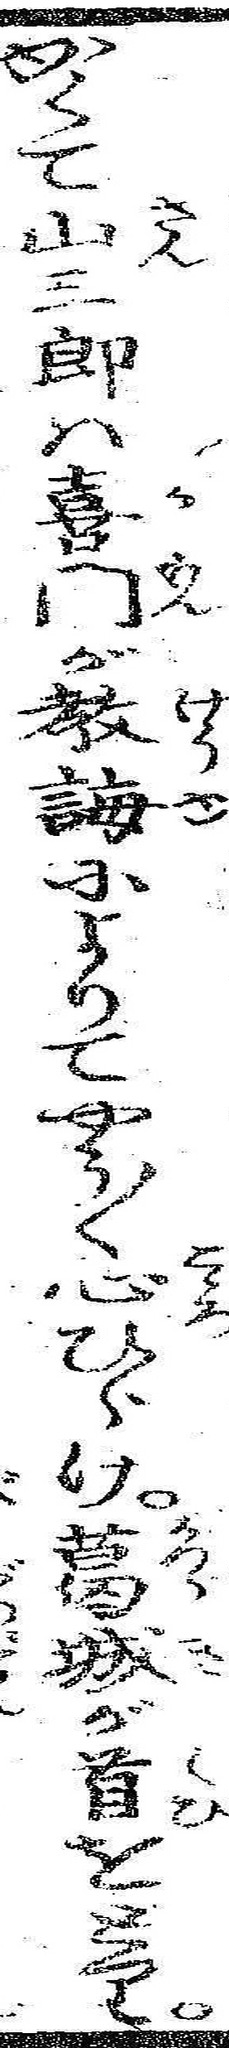かくて山三郎は嘉門が教誨によりてやう〳〵心ひらけ。葛城が首をとり。
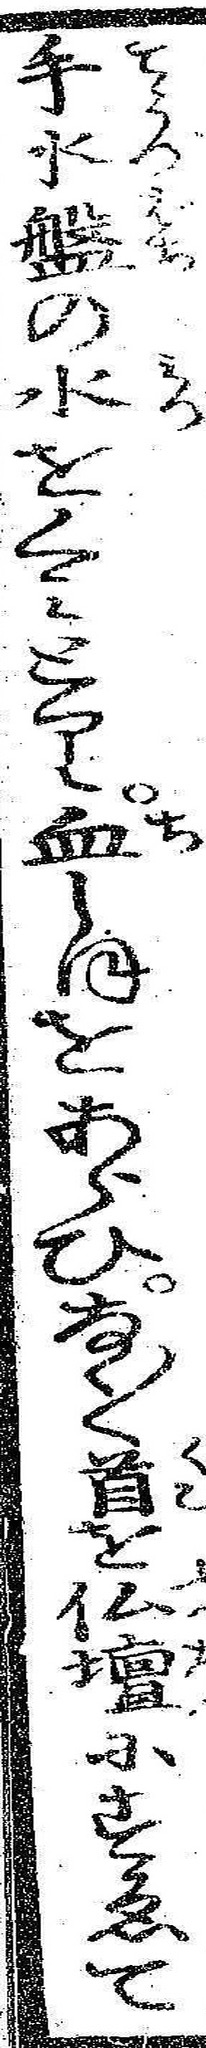手水盤の水をくみとり。血しほをあらひ。なく〳〵首を仏壇にすゑて。
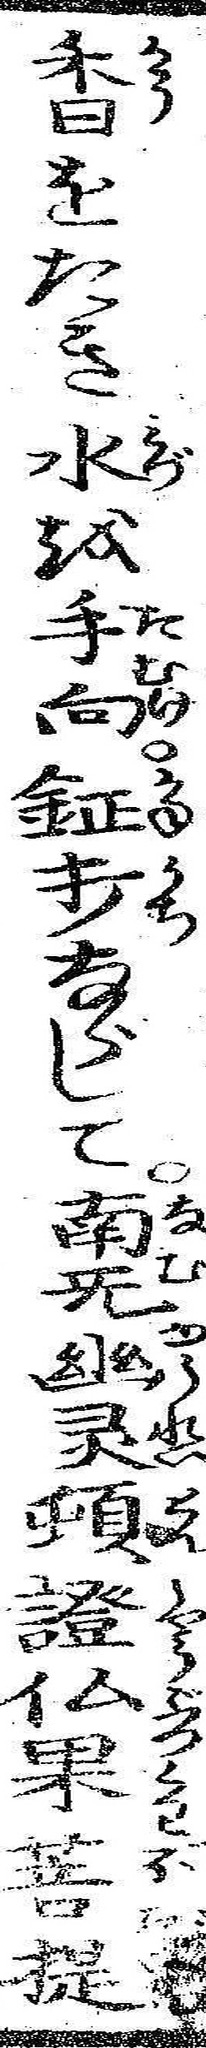香をたき水を手向。鉦打ならして。南無幽霊頓証仏果菩提
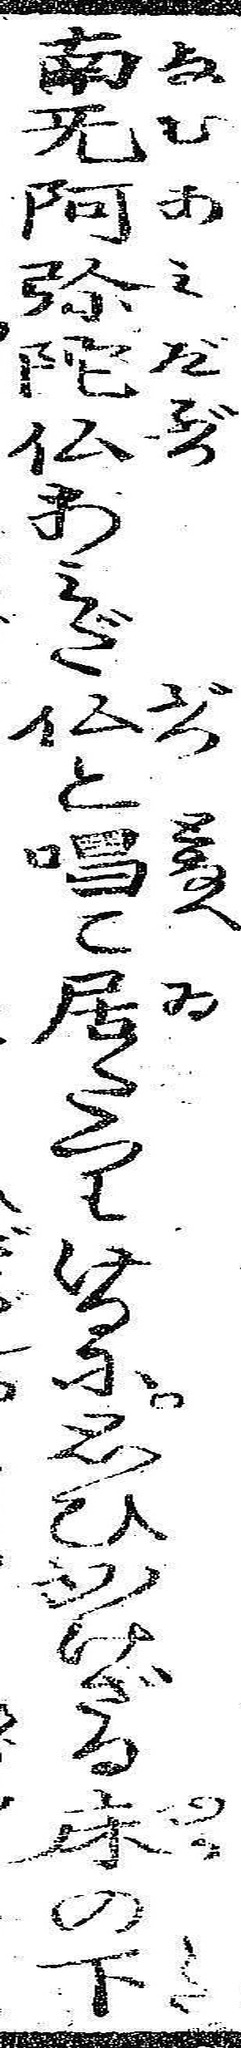南無阿弥陀仏あみだ仏と唱て居たりけるに。思ひかけざる床の下
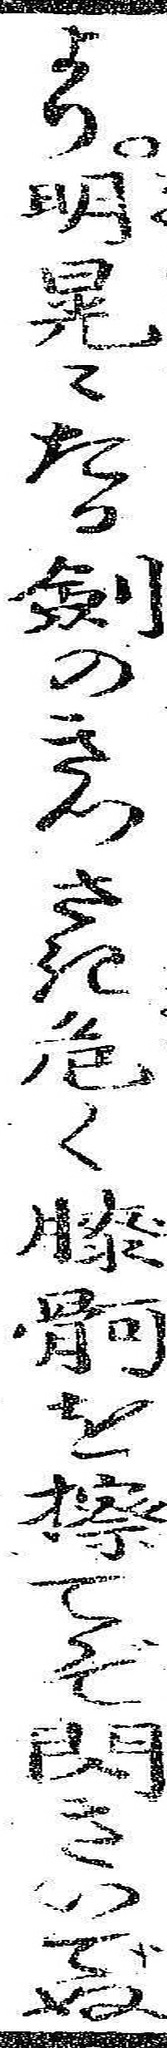より。明晃々たる剣のきつさき危く膝䯊を擦てぞ閃きいでぬ。
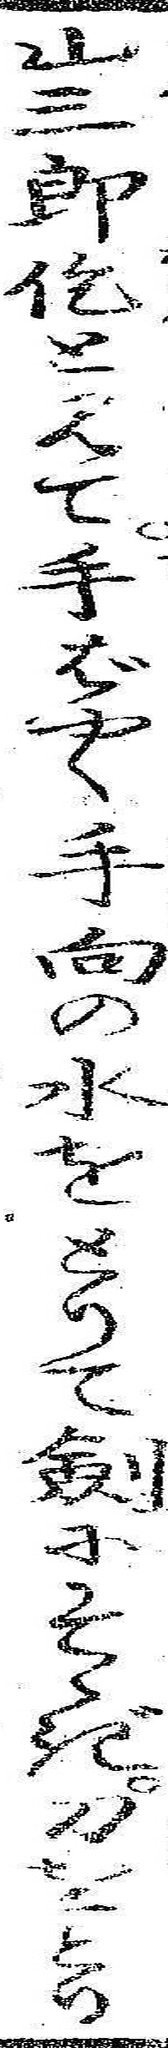山三郎仡と見て。手ばやく手向の水をとりて剣にそゝぎ。刀をとり
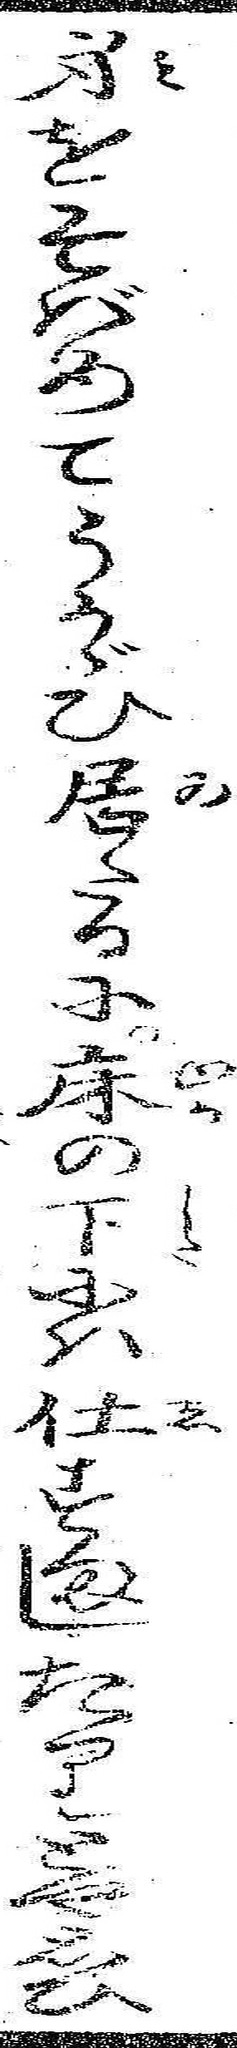身をそばめてうかゞひ居たるに。床の下には仕すましたりとや思ひ
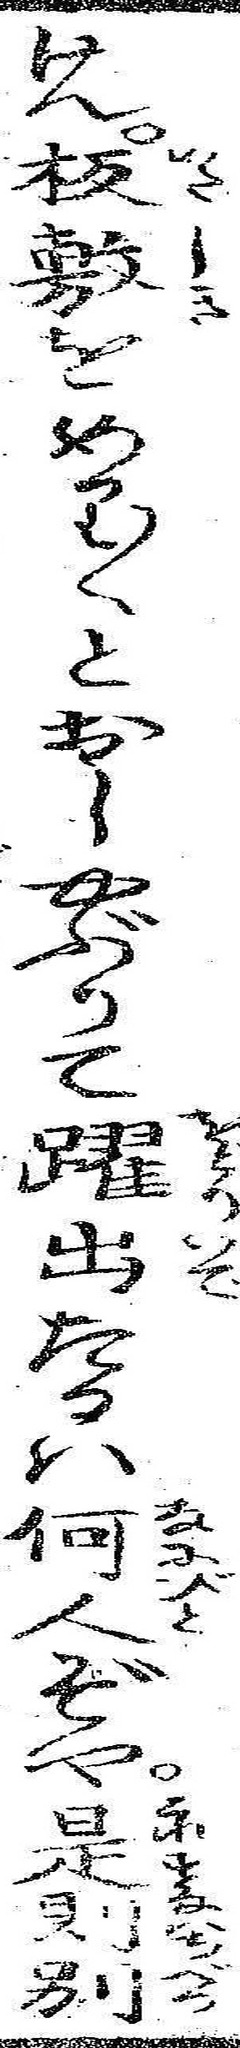けん。板敷をめり〳〵とおしやぶりて躍出たるは何人ぞや。是則別
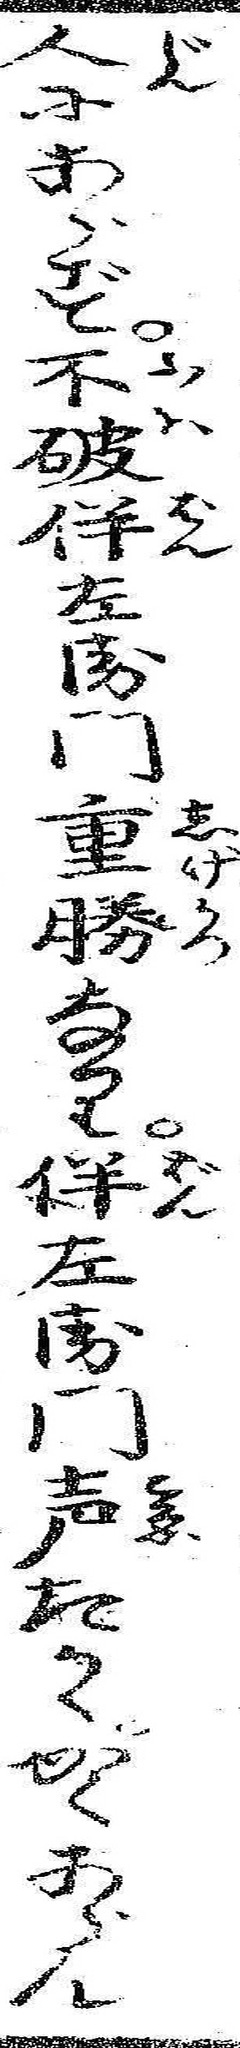人にあらず。不破伴左衛門重勝なり。伴左衛門声たかく。かくあらん
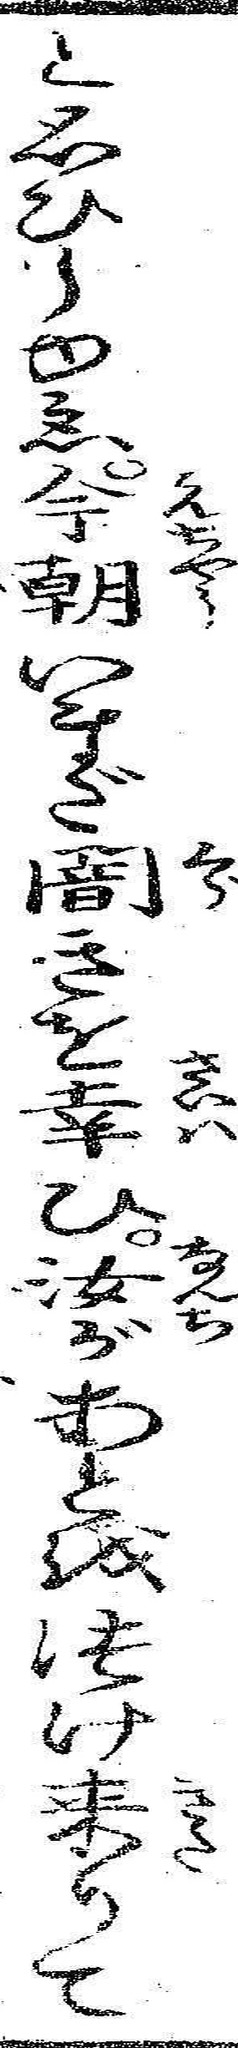と思ひしゆゑ。今朝いまだ闇きを幸ひ。汝があとをつけ来りて
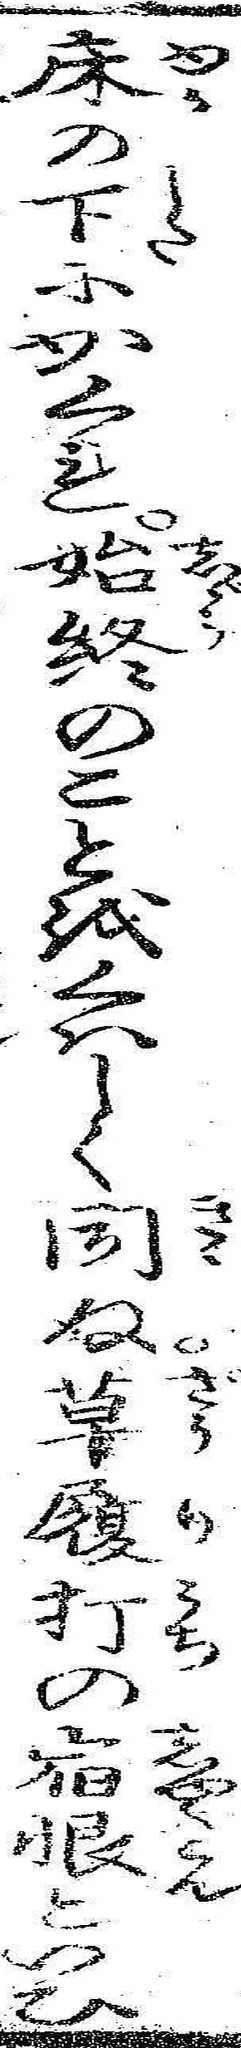床の下にかくれ。始終のことをくはしく聞ぬ。草履打の宿恨といひ
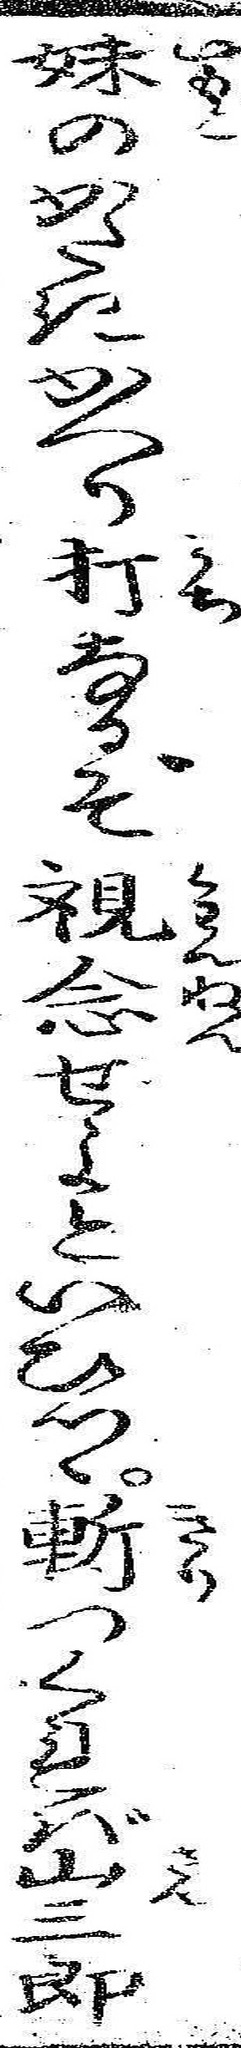妹のかたきかへり打なるぞ観念せよといひつゝ。斬つくれば山三郎
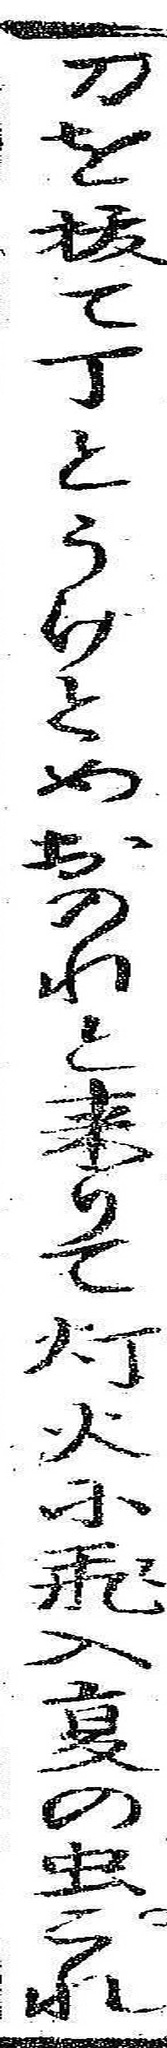刀を抜て丁とうけとめおのれと来りて灯火に飛入夏の虫。これ
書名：昔話稲妻表紙
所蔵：国文学研究資料館
